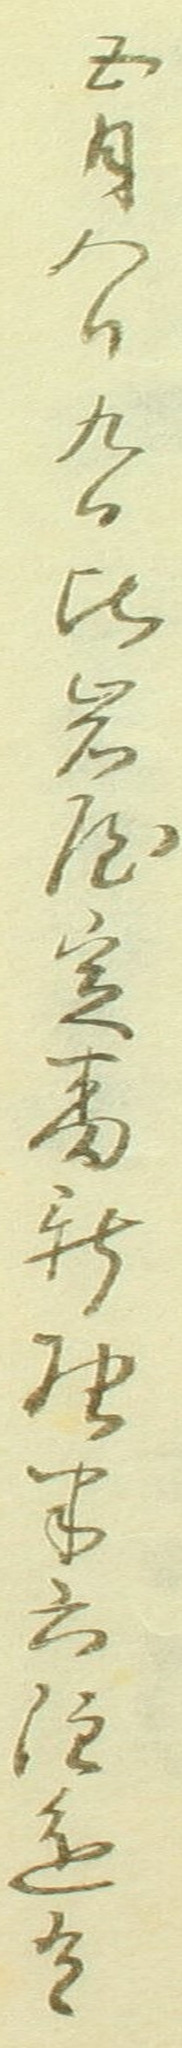五月八日九日頃岩屋定番新野半六注進有
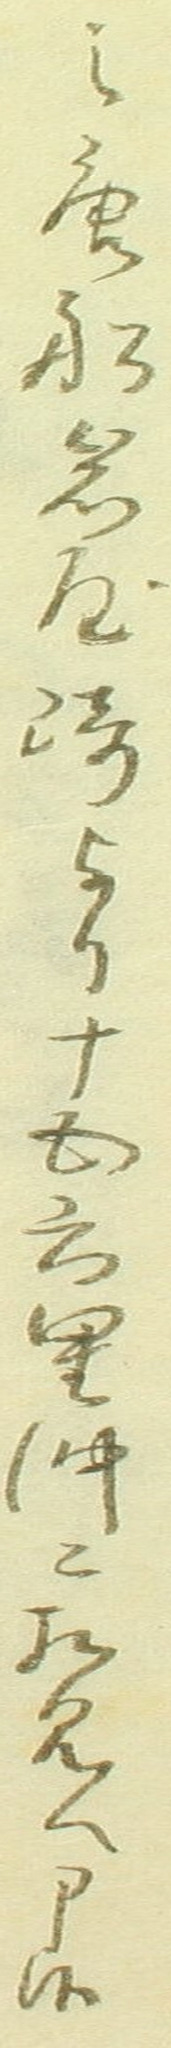之唐船岩屋崎より十五六里沖に相見へ申候
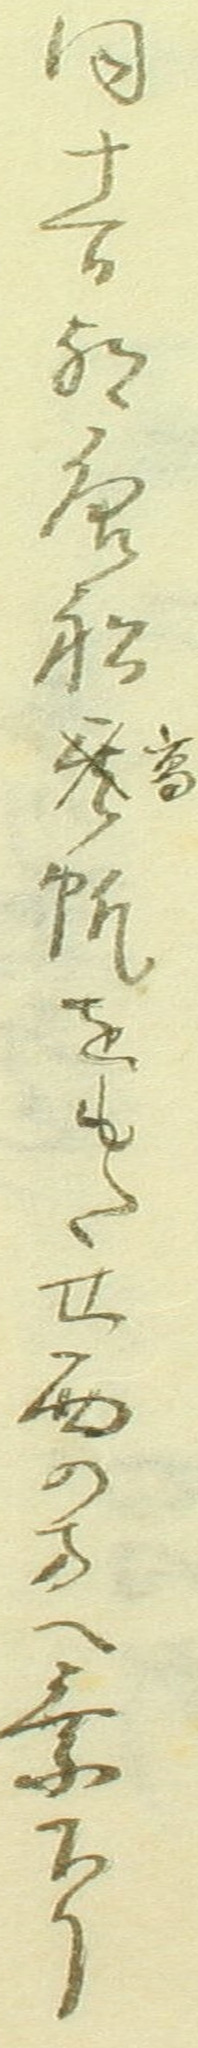同十一日朝唐船其高帆をもたせ西の方へ乗下り
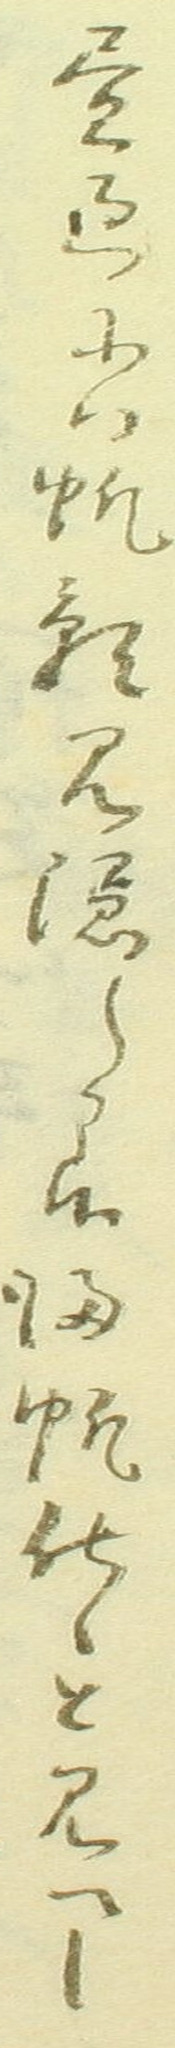昼迠には帆類見隠し申候扨帆仕候と見へし
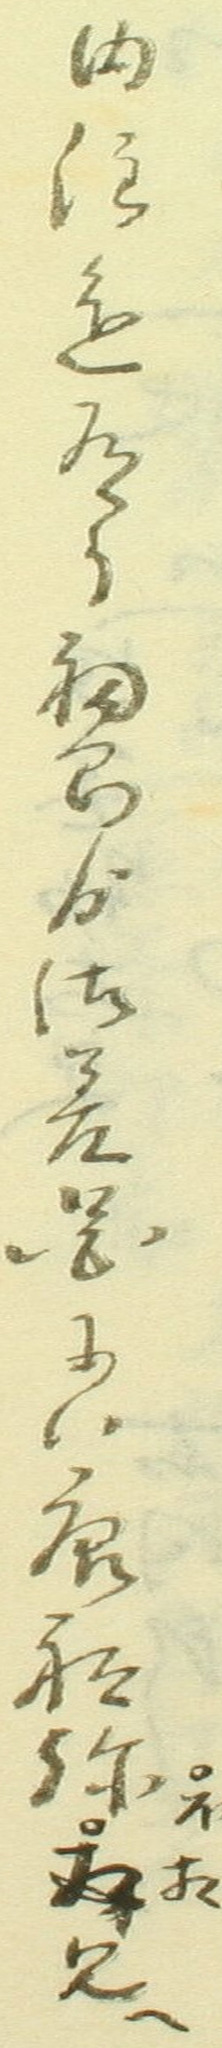由注進有り物見ゟ御差図には唐船弥？不相見へ
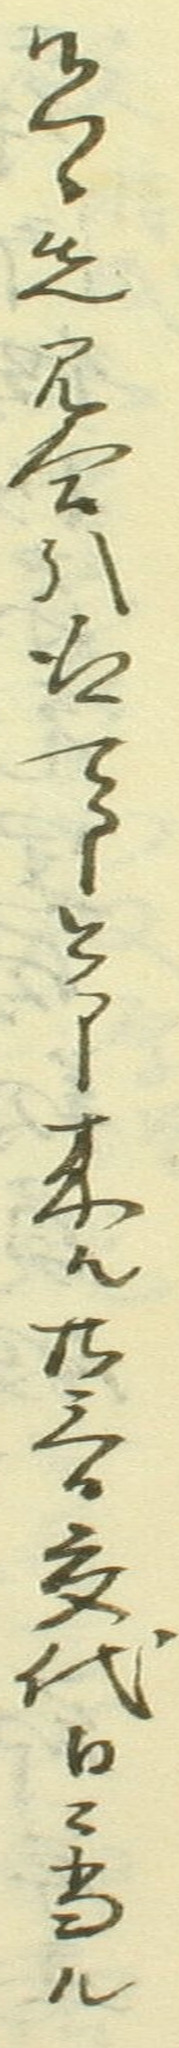候はは先見合引取可申と申来る廿三日交代日に当る
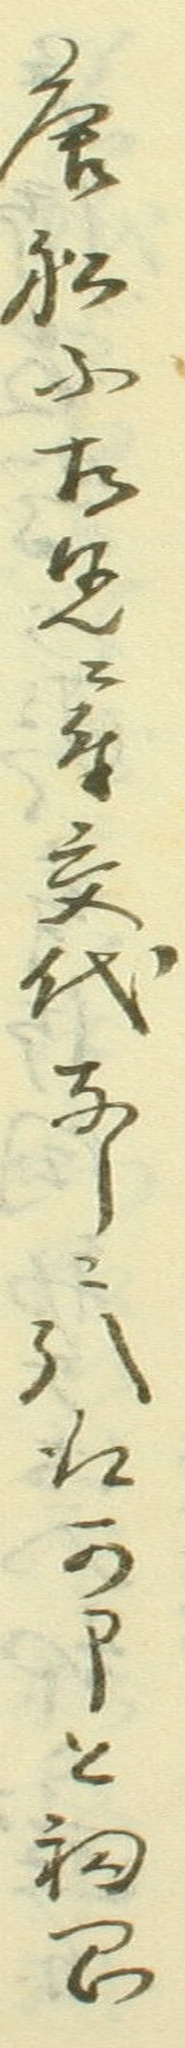唐船に相見に付交代なしに引取可申と福岡
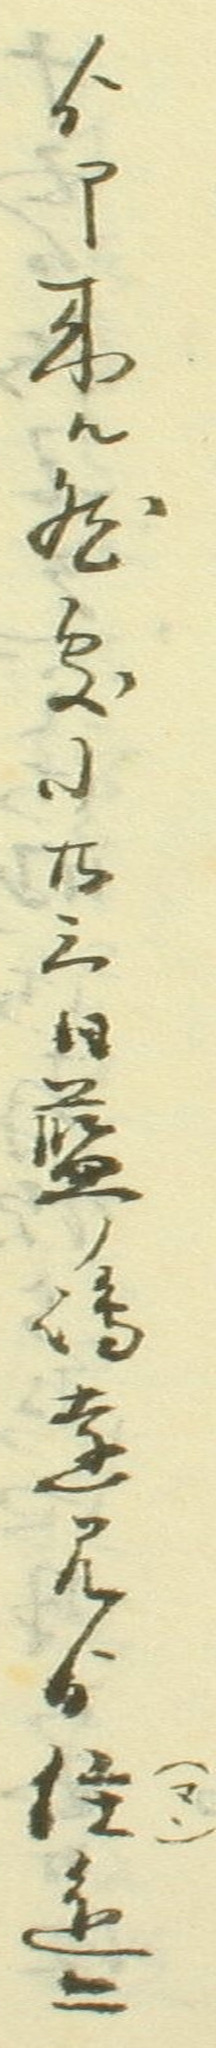ゟ申来る然處に廿三日藍の嶋遠見ゟ住遠に
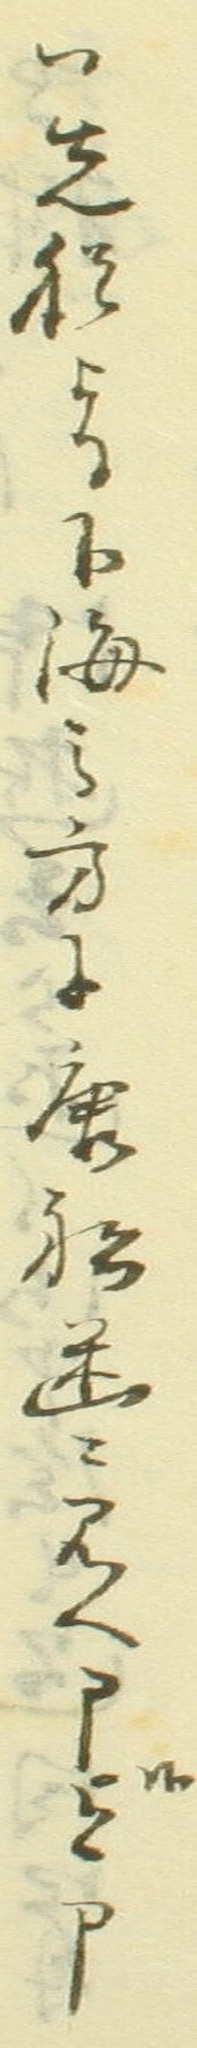は先程より下海之方に唐船連連見へ申候と申
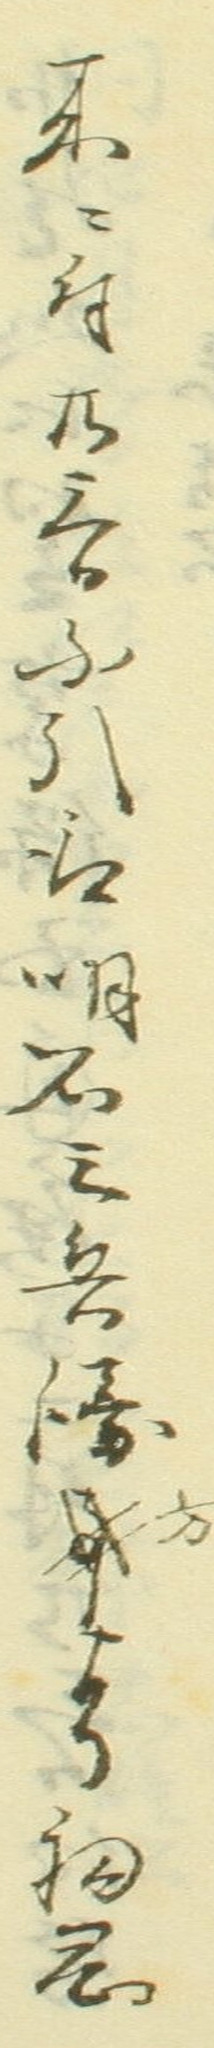来に付廿三日不引取明石三兵衛？より福岡
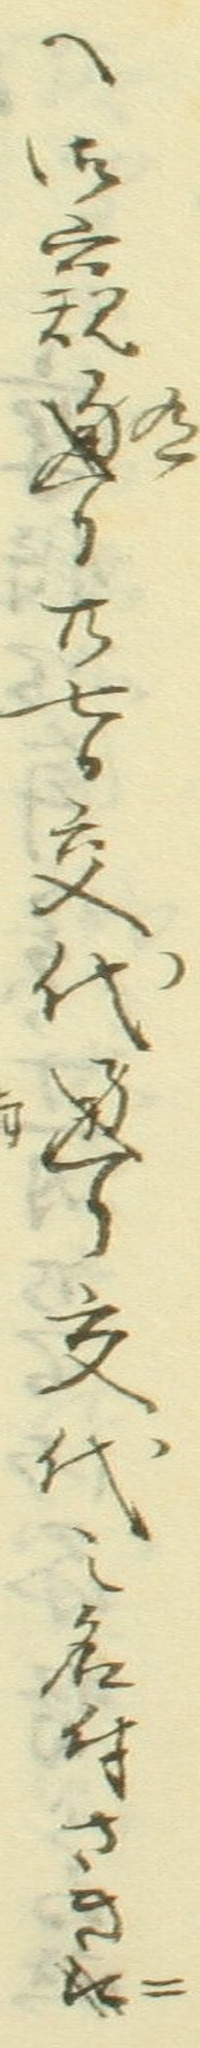御？規？有り廿七日交代通有り交代之名付さきに
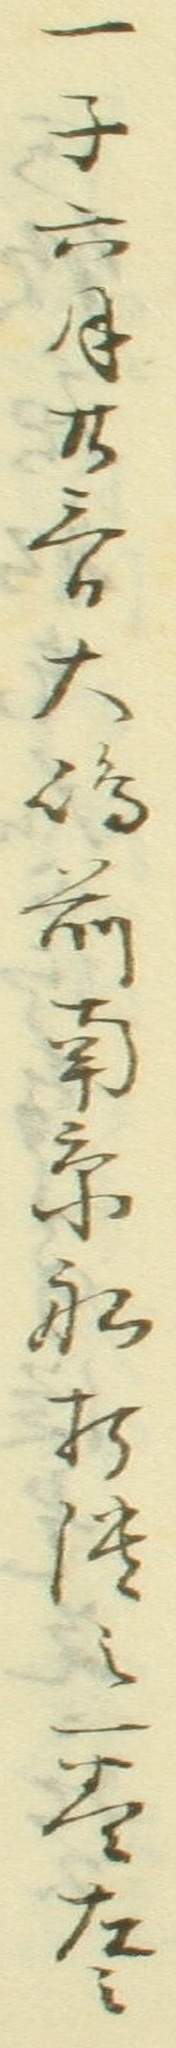一子六月廿三日大嶋前南京船打潰之一？左之
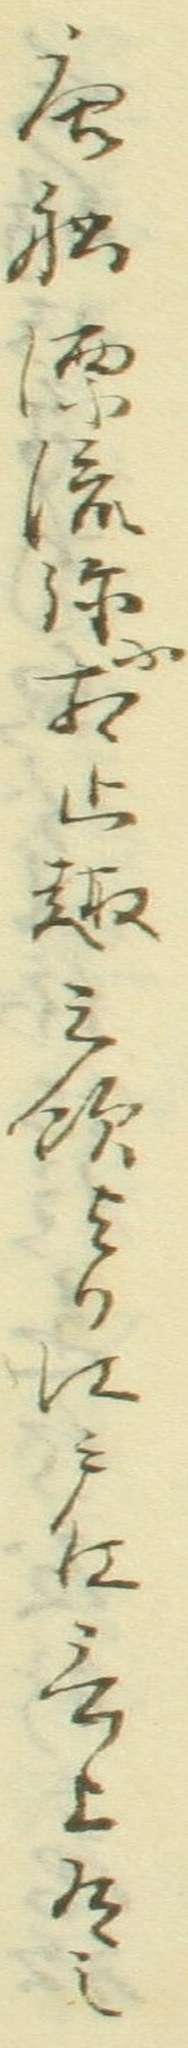唐船漂流弥に相止趣之領より江戸江云上有之

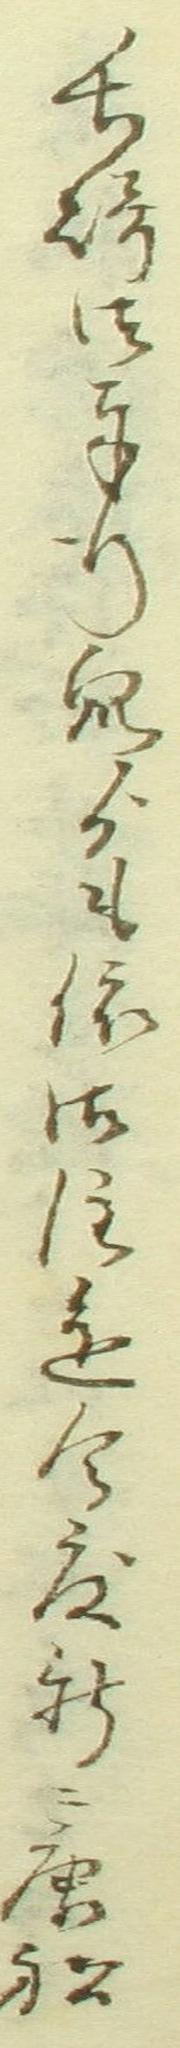長崎御奉行衆ゟも依御注進今度新に唐船
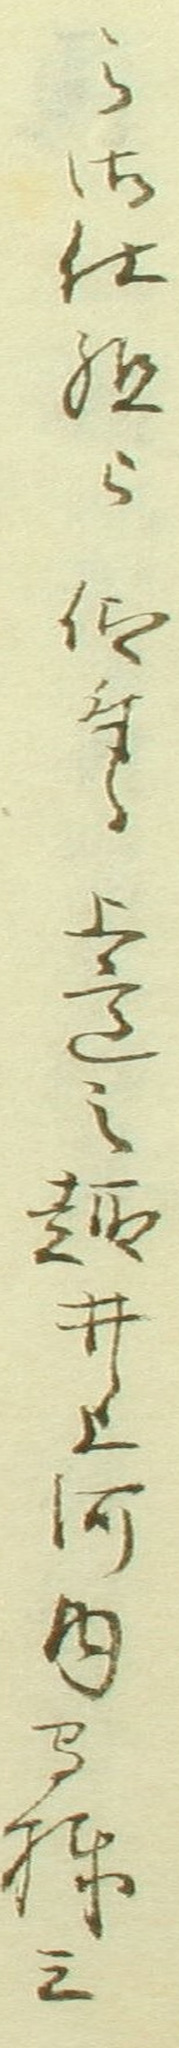之御仕組被仰付候上迄之趣井上河内守様之
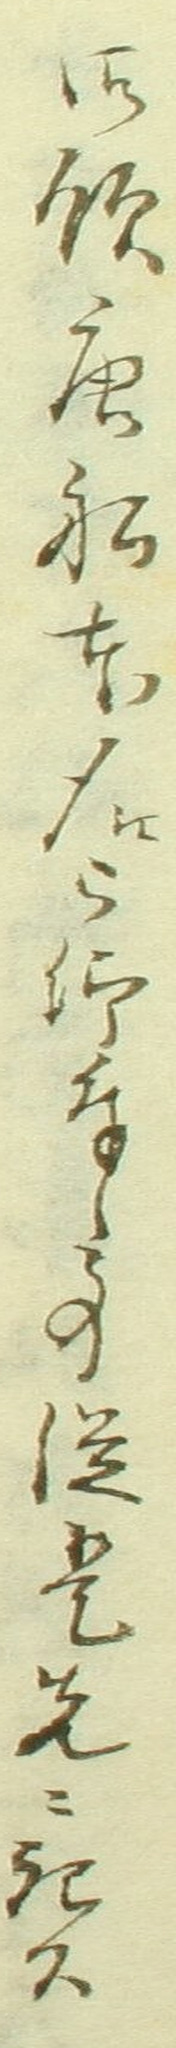御領唐船本〆江被仰付候事従是先に記す
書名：唐船漂流記 四
